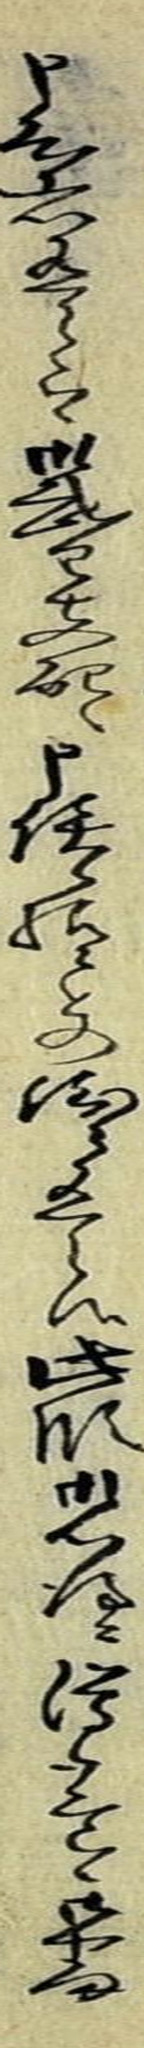申度者有之候はヽ御武具支配へ申談候様との儀に有之候此段御心得に得御意候御番
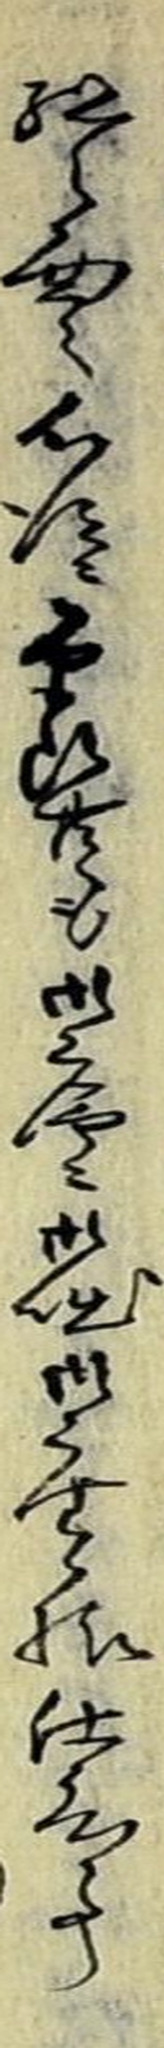組之面々心得に筆頭共へも御序に御咄御座候様仕度事
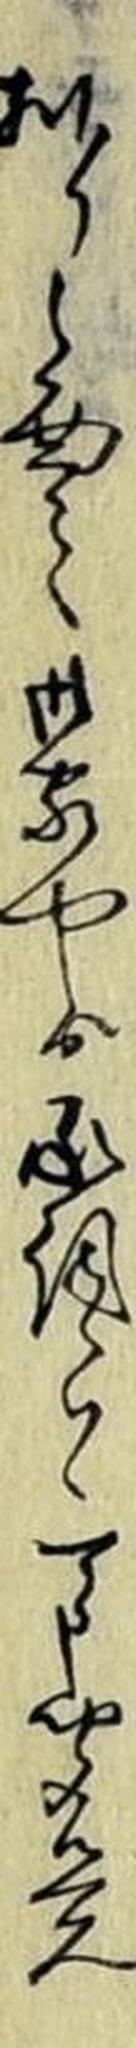掛り之面々御家中ゟ承調候はヽ可申聞覚
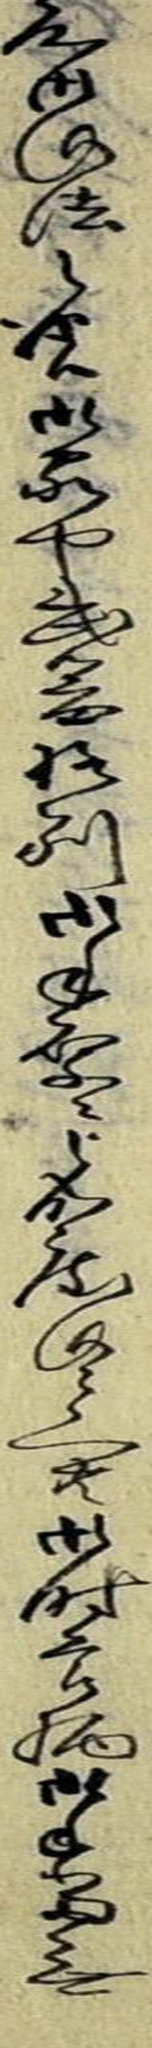○今度御趣法之儀は御家中武器格別御手厚に被成度趣に候へ共御時節柄御手当無
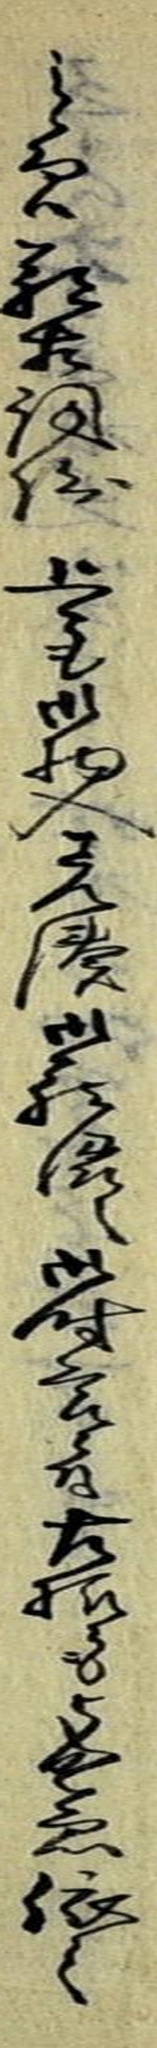之候而は難相調儀上にも御物入差湊御難渋之御時節に付左様にも被成兼依之
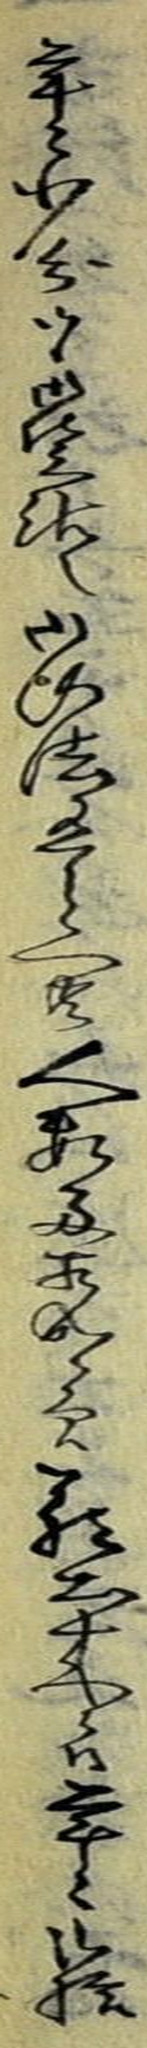年々少分つヽ御貸銀之御趣法有之候へ共人数多相成候而は難出来に付年々弐拾
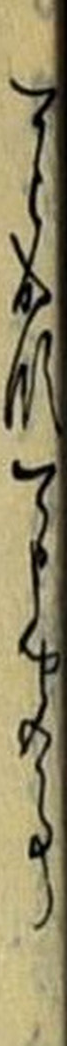可被成段可申聞事
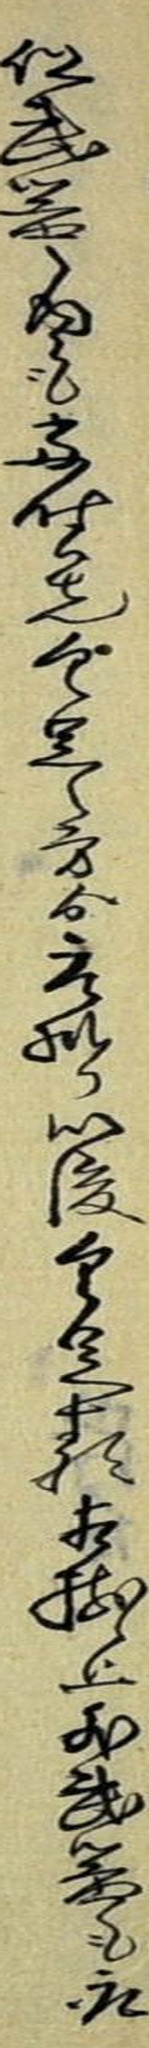但武器之内にも当時は先具足之方ゟ取掛り以後具足類相残候上外武器へも取
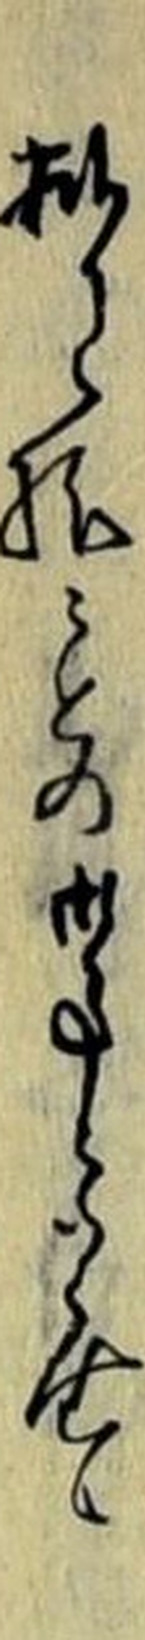掛り候様にとの御事に御座候
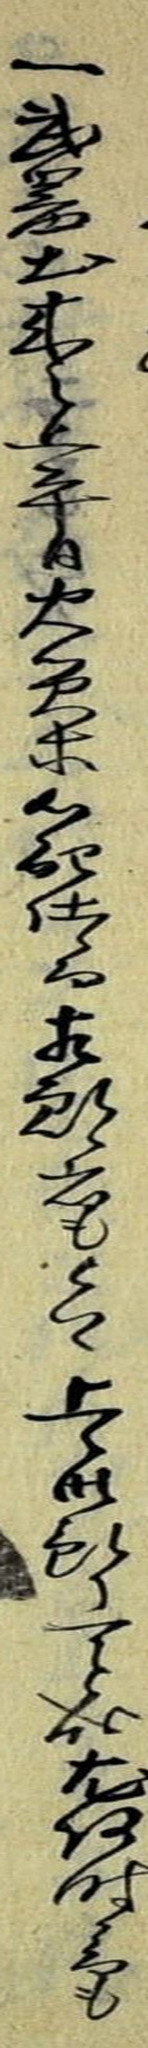一武器出来候上平日火災等心配仕候而相願候者も候はヽ上へ御預り可被成尤何時に而も
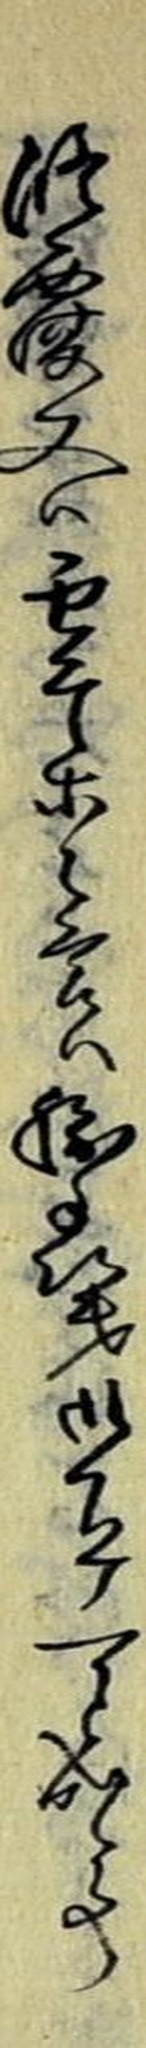修覆又は虫干等之節は勝手次第御下ヶ可被成候事
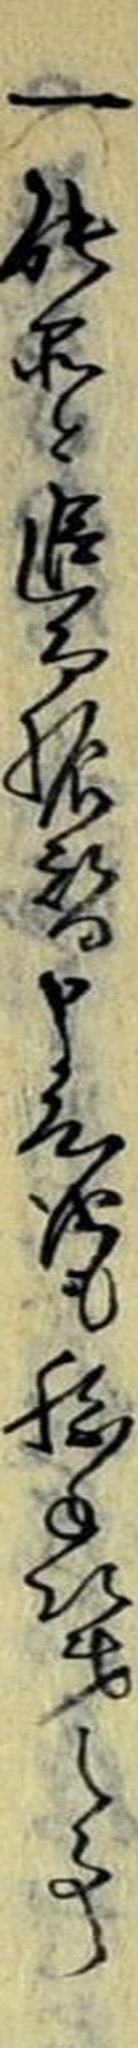一能品々追而振替申度儀も勝手次第之事
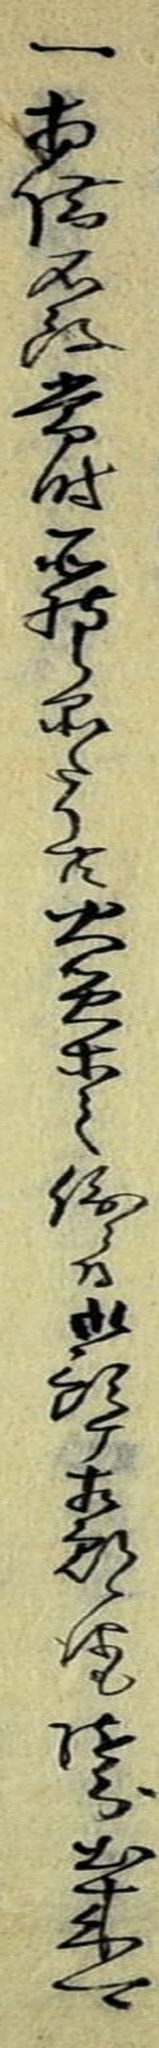一拝借不致当時所持之品たり共火災等之儀に付御預ヶ相願候儀も随分出来可
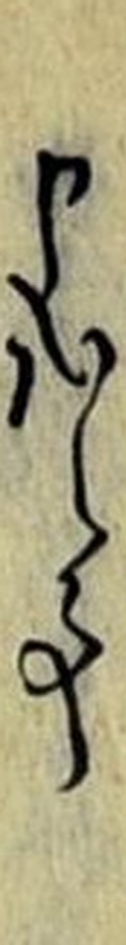申哉之事
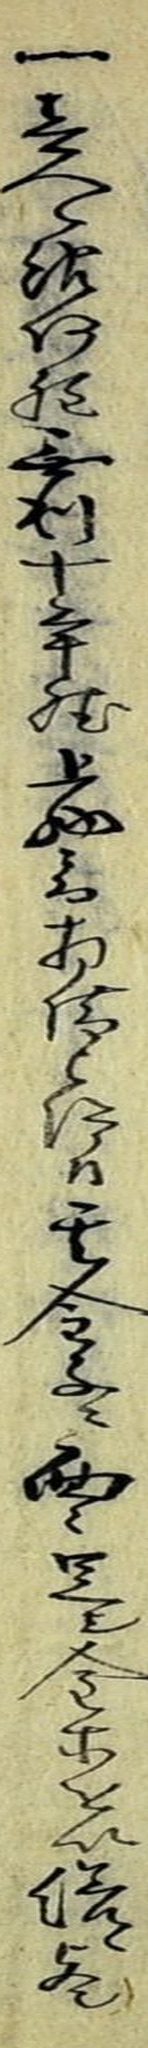一壱人へ銀何程無利十年賦上納に而拝借被仰付其金子に面々足し金等を以繕候歟
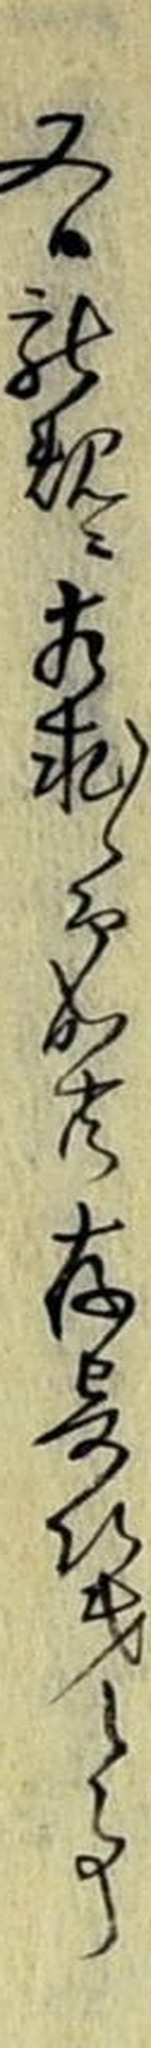又は新規に相求候而成共存寄次第之事
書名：命令之部 四
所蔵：福井県文書館 Fukui Prefectural Archives
